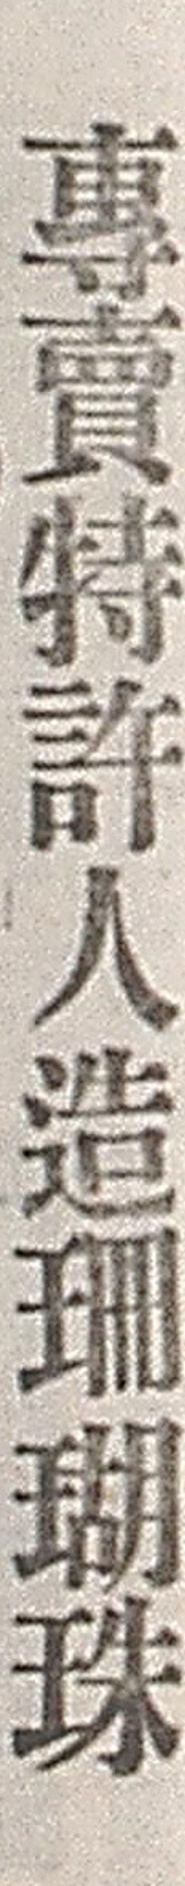専売特許人造珊瑚珠
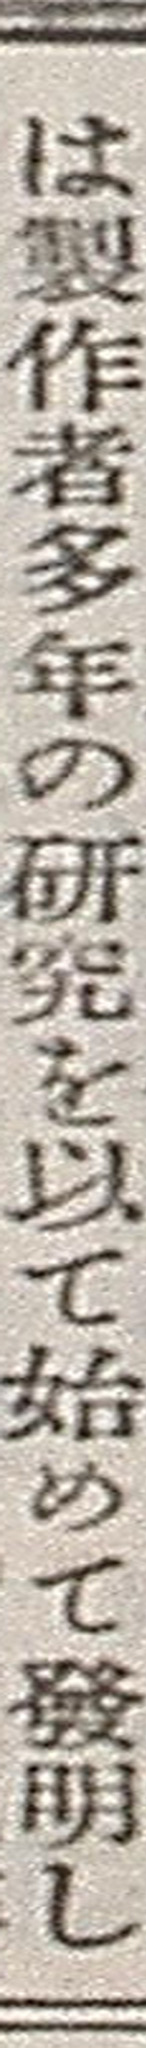は製作者多年の研究を以て始めて発明し
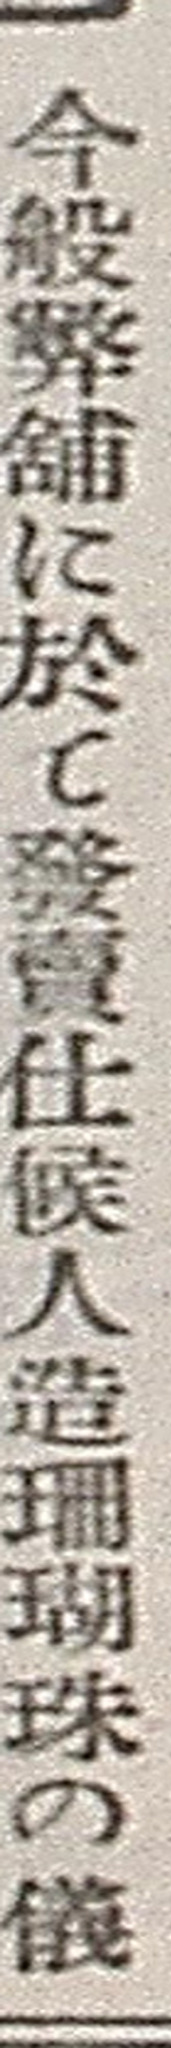今般弊舗に於て発売仕候人造珊瑚珠の儀
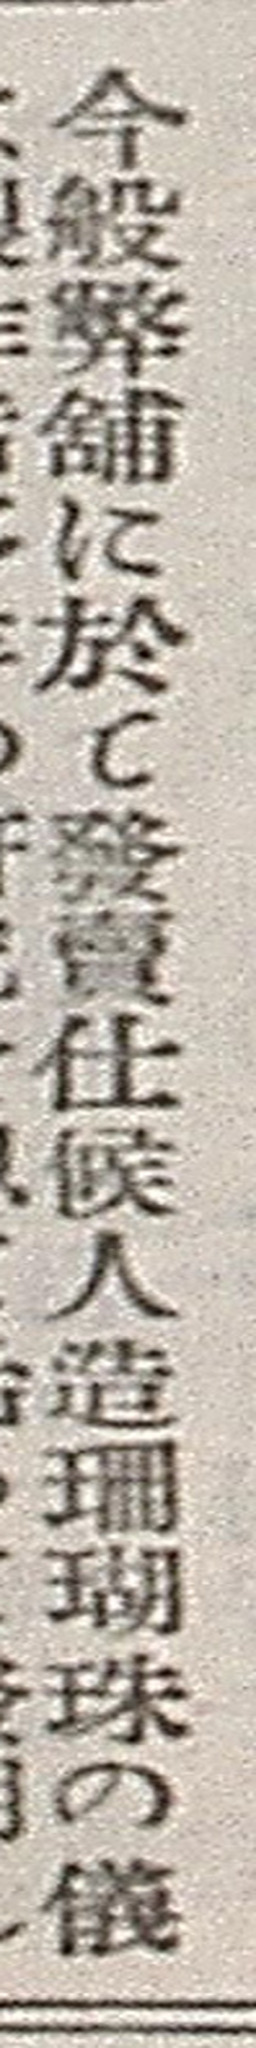今般弊舗に於て発売仕候人造珊瑚珠の儀
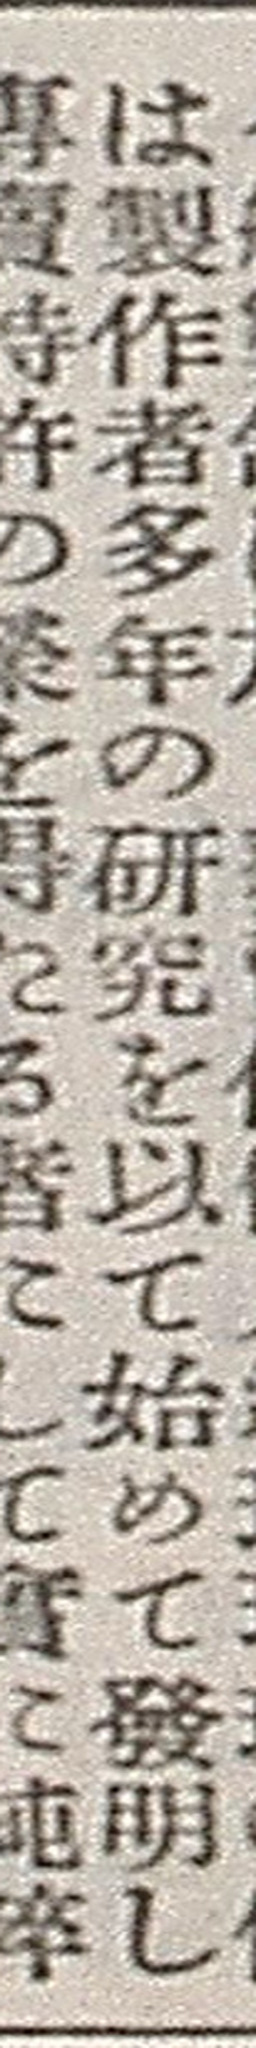専売特許の栄を得たる者にして実に純粋
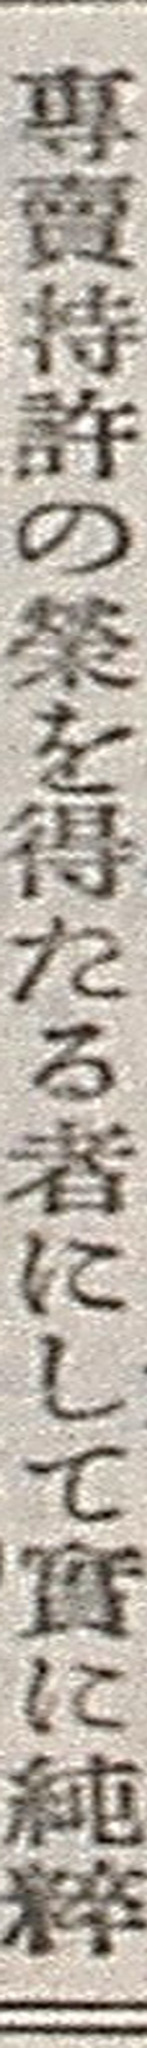専売特許の栄を得たる者にして実に純粋
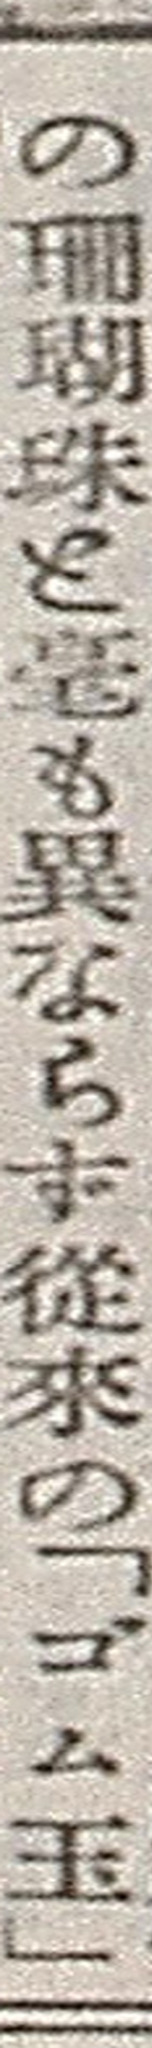之珊瑚珠と毫も異ならず従来の「ゴム玉」
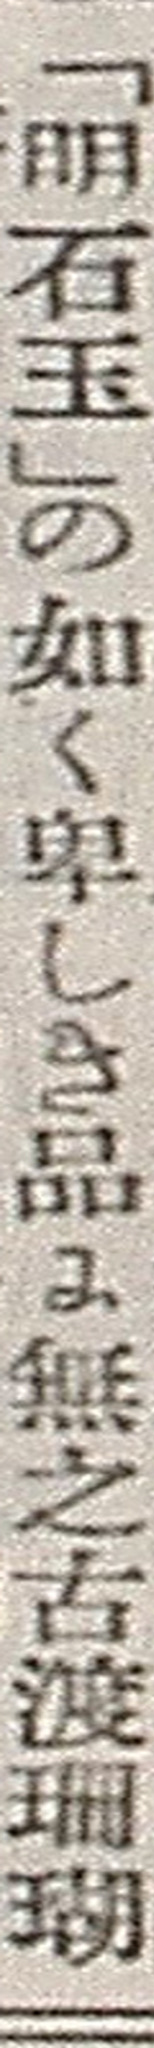「明石玉」の如く卑しき品に無之古渡珊瑚
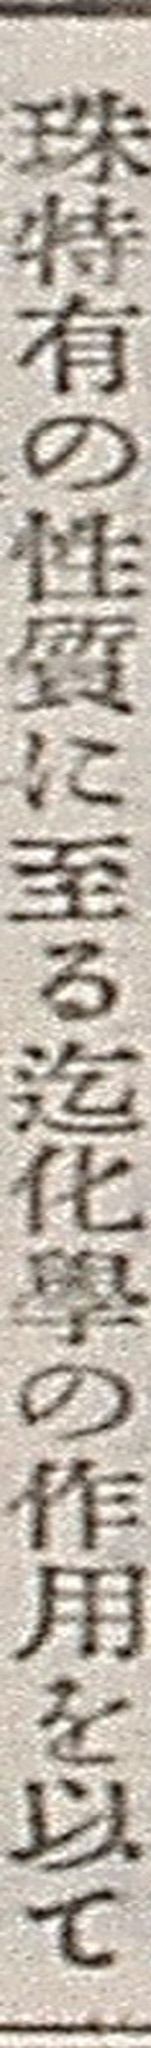珠特有の性質に至る迄化学の作用を以て
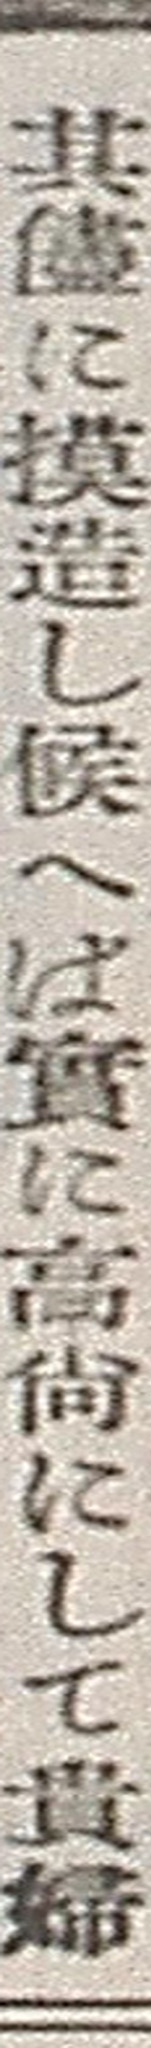其侭に模造し候へば実に高尚にして貴婦
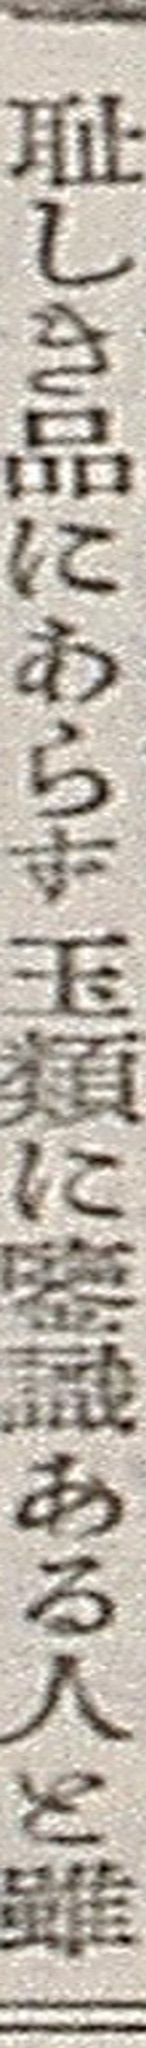恥しき品にあらず玉類に鑿識ある人と雖
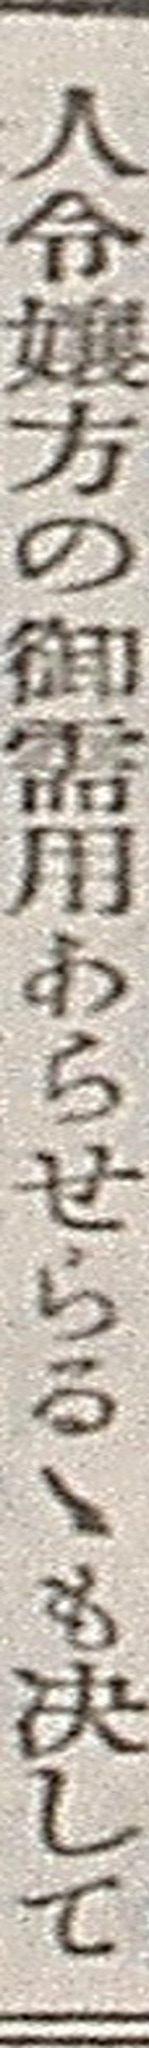人令嬢方の御需用あらせらるゝも決して
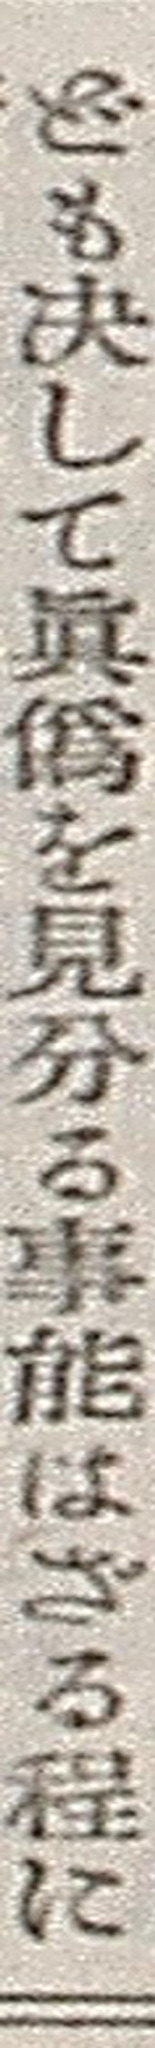ども決して真偽を見分る事能はざる程に
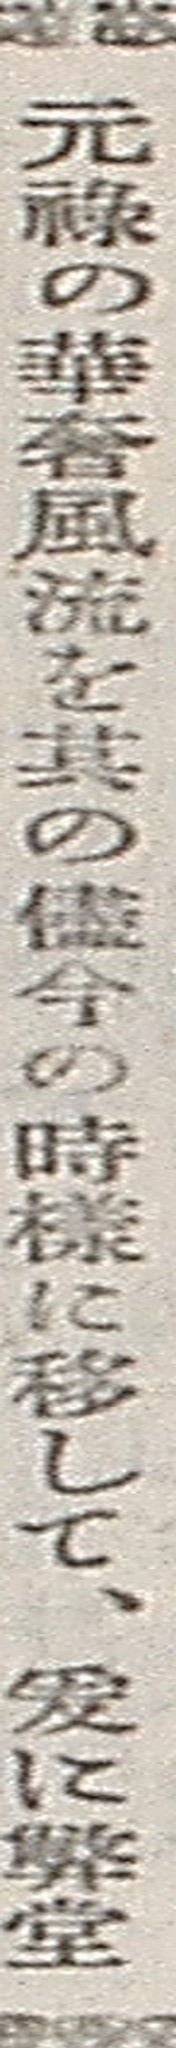元禄の華奢風流を其の儘今の時様に移して、爰に弊堂
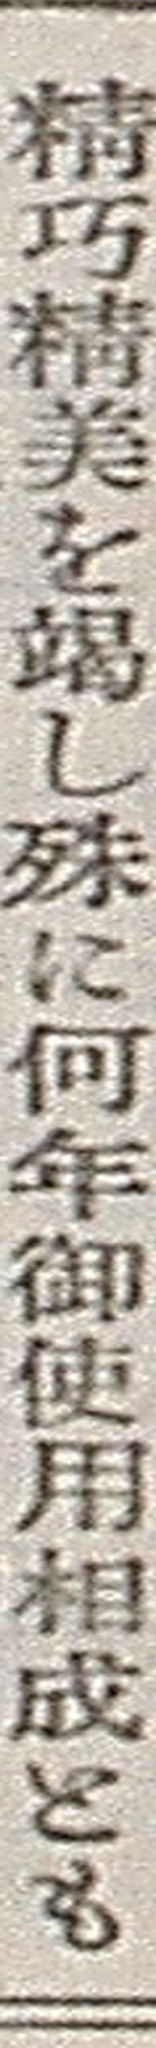精巧精美を竭し殊に何年御使用相成とも
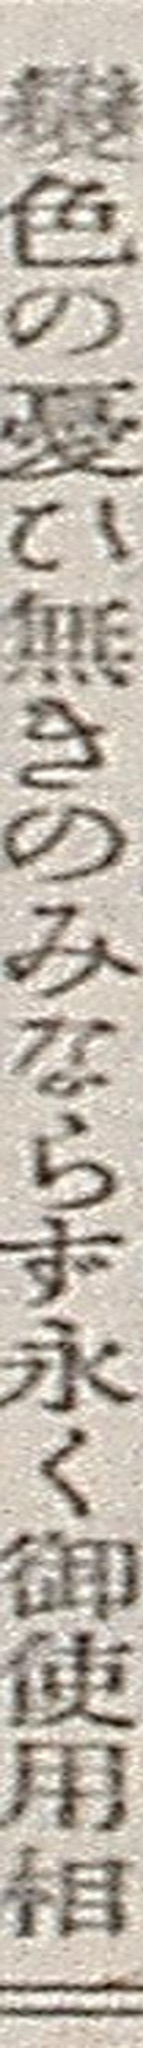変色の憂ひ無きのみならず永く御使用相
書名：風俗畫報臨時増刊第百二十四號　洪水地震被害録（上）
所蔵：東京大学地震研究所図書室 Earthquake Research Institute Library, The University of Tokyo, JAPAN
